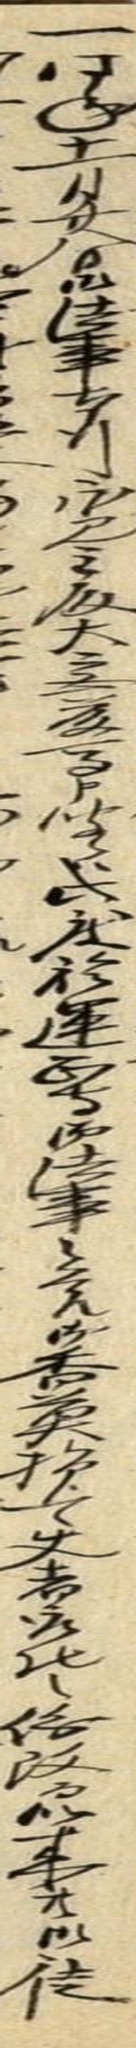一同年十一月廿八日御法事奉行永見主殿大宮藤馬申聞候は此度於運正寺御法事之節御香奠指上候使者取次之儀改而以来共御徒
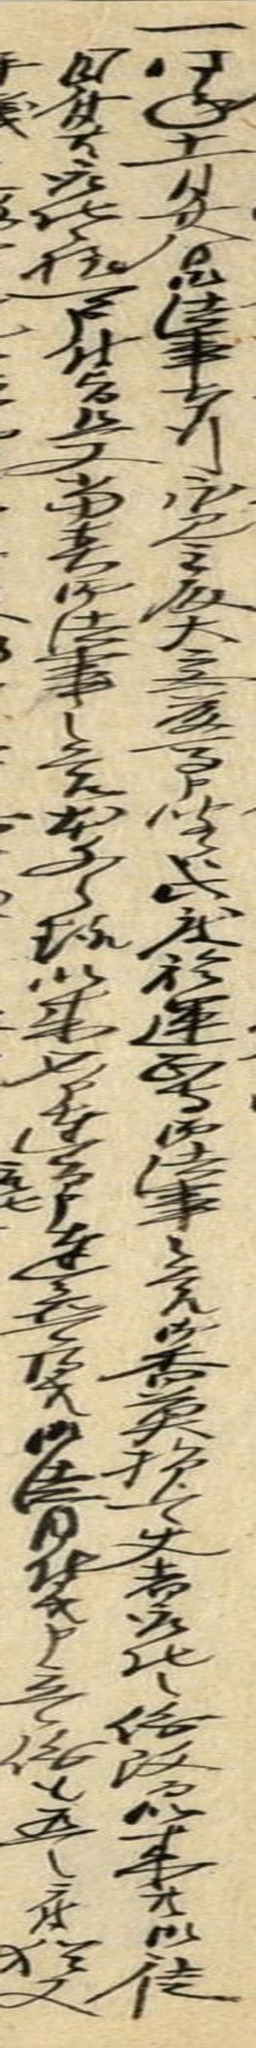目付共へ取次候様可申旨且又当春御法事之節本文之趣以来不申達旨申達置候得共御徒目付共申立候儀も有之に付猶又
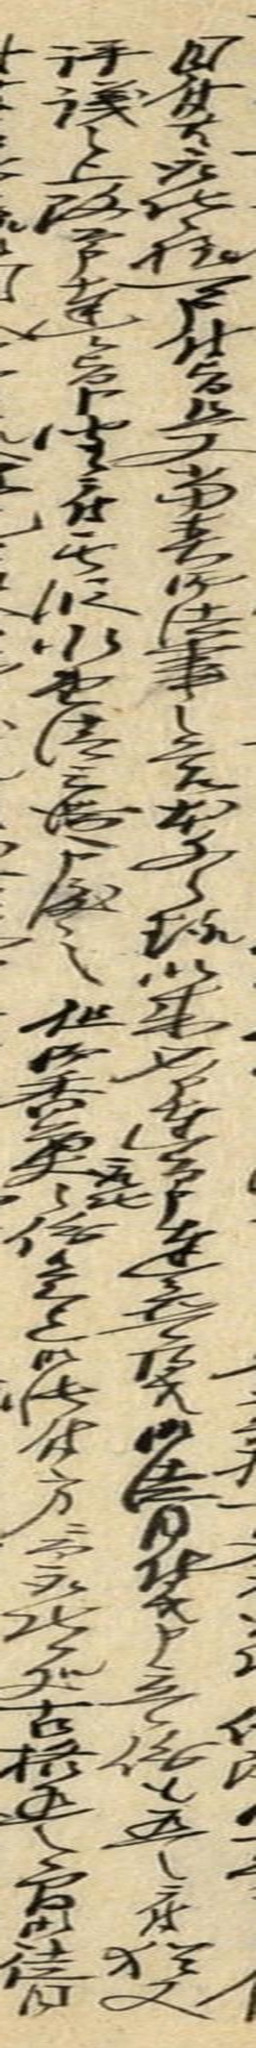評議之上改而申達候旨申聞候に付其段水野清兵衛へ申渡之但御香奠取次之儀是迄御帳付方に而取次候処古格有之候間御徒目
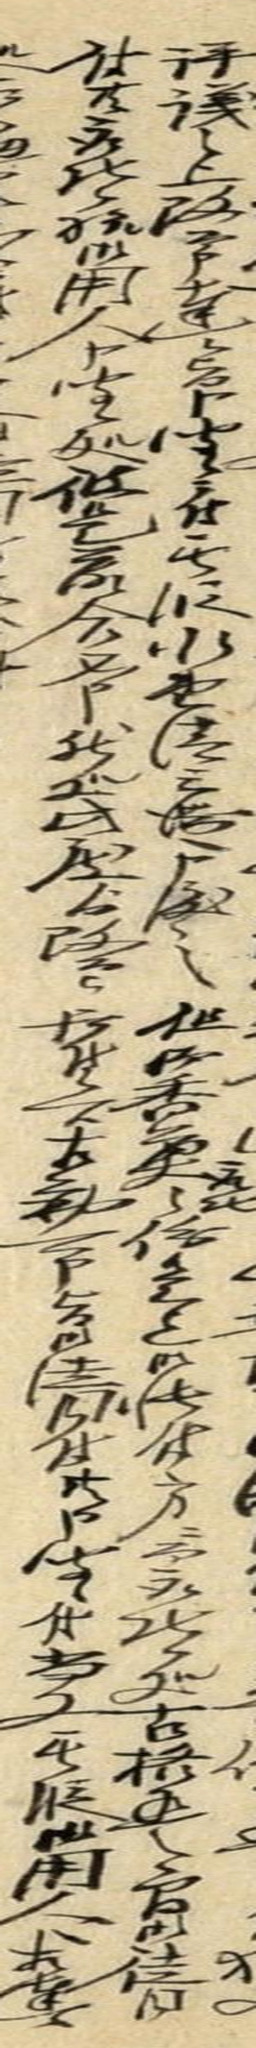付共取次候様御用人申聞候処彼是落合不申然処此度ゟ改而被仰付候へは相勤可申旨御徒目付共申聞候に付尚又其段御用人へ相達候
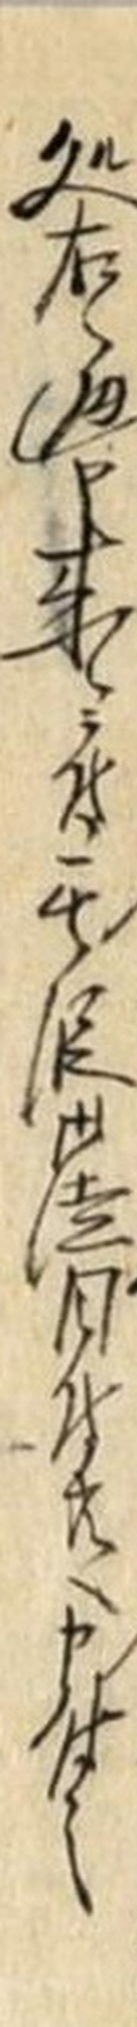処右之通申来候に付其段御徒目付共へ申付之

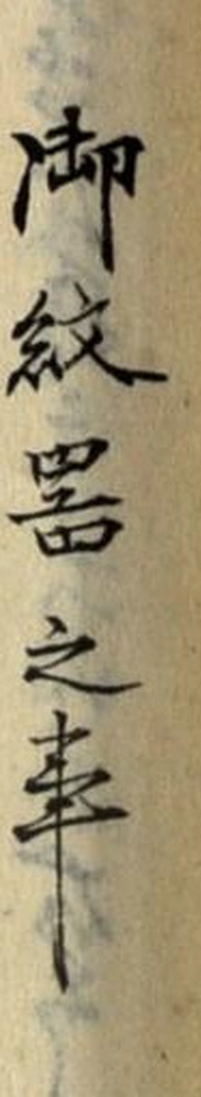御紋器之事
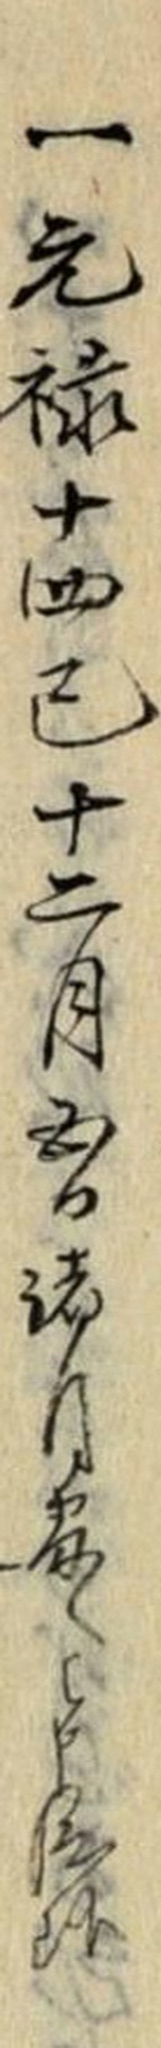一元禄十四巳十二月五日諸月番へ被申渡趣
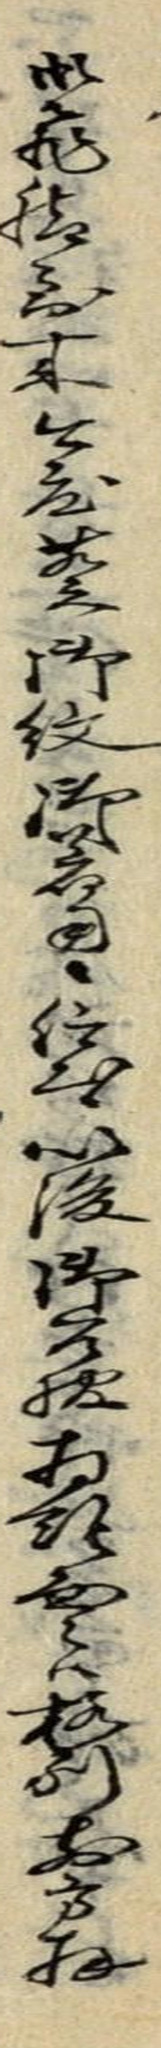御飛脚到来今度葵御紋御着用被仰出候以後御召服拝領候面々は格別前方拝
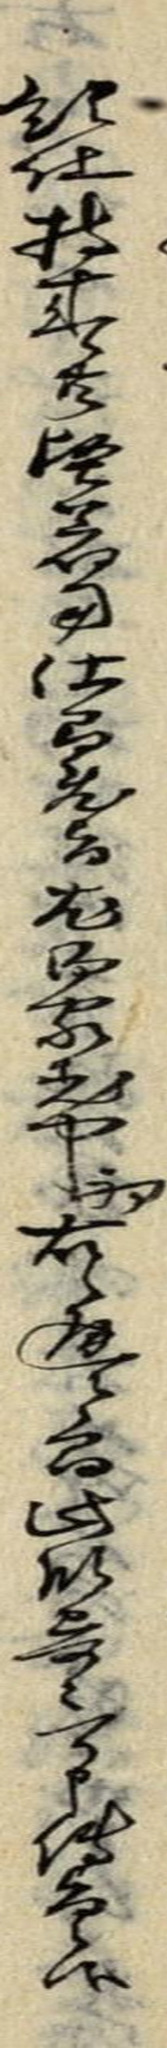領仕持来候共堅着用仕間敷旨尤御家老中初右之通候間此段寄々可申伝旨に候
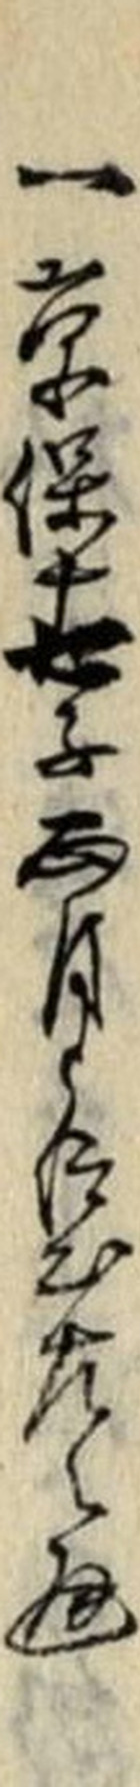一享保十七子正月被仰出左之通
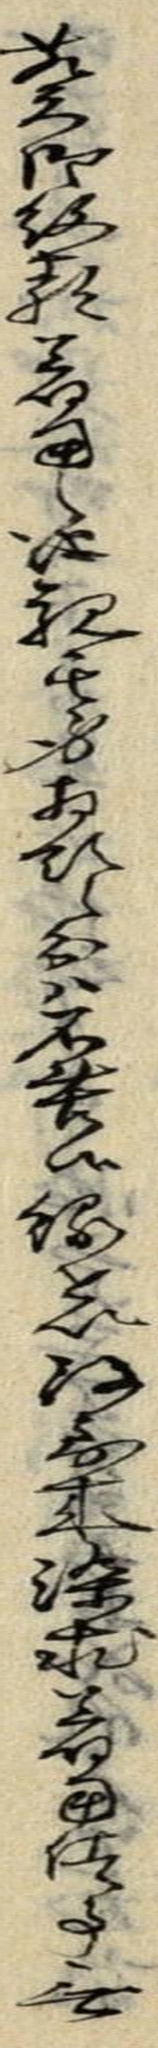葵御紋類着用之儀親其身拝領之分は不苦候縁を以致到来染求着用仕候事無
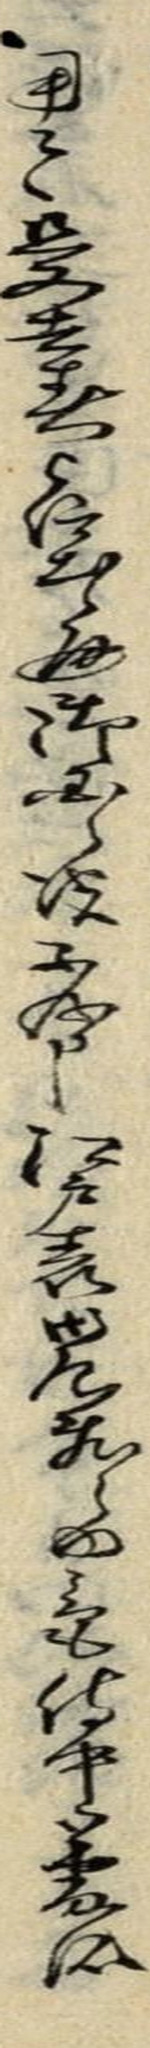用に候且又去春被仰出候通御国之儀は不及申江戸表御屋敷之内に而も侍中御番所
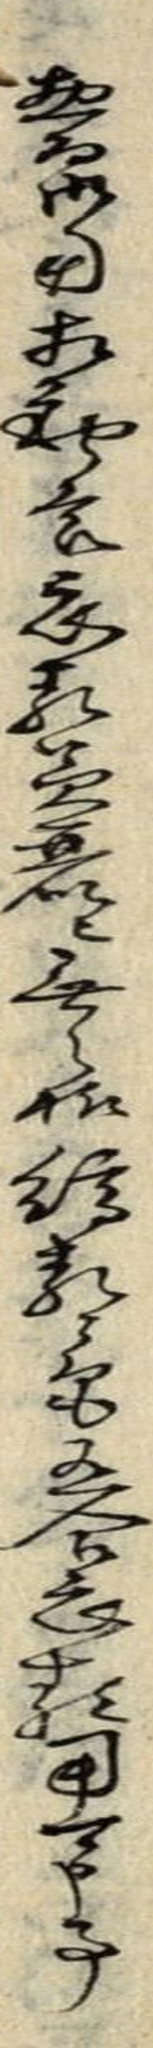惣而御用相勤候節衣類美悪に無之候様縞類に而も有合衣類用可申候事
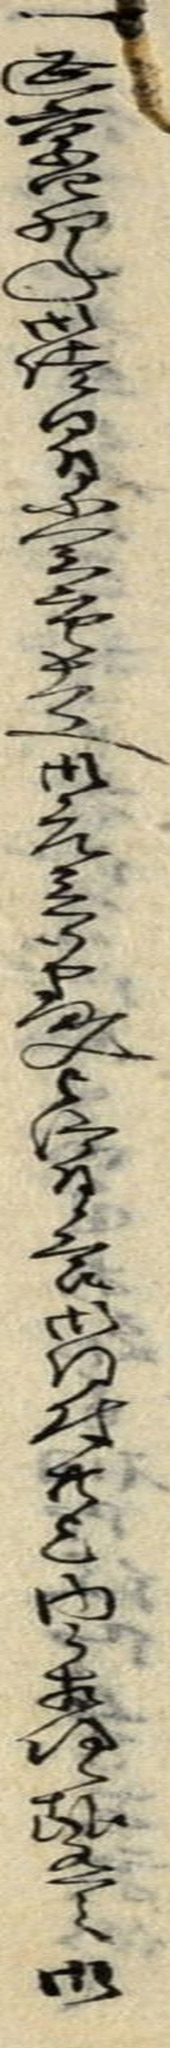一延享四卯年御徒目付小関市郎太夫御取立御番入被仰付候節御目付共迄内々相伺候趣有之御
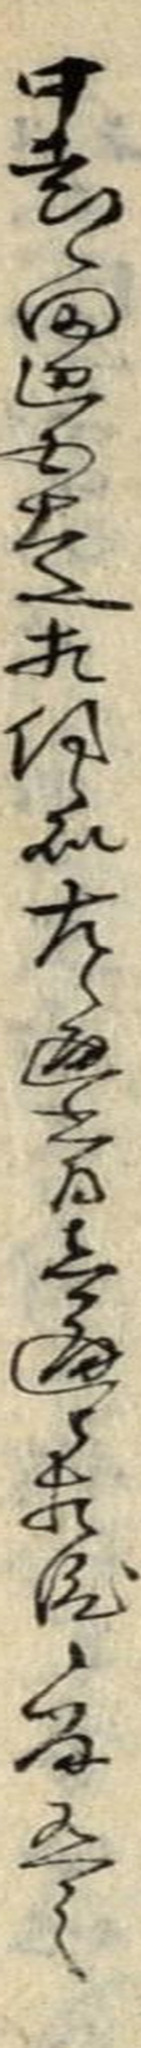中老へ田辺五太夫相伺候処左之通書付壱通被相渡候留有之
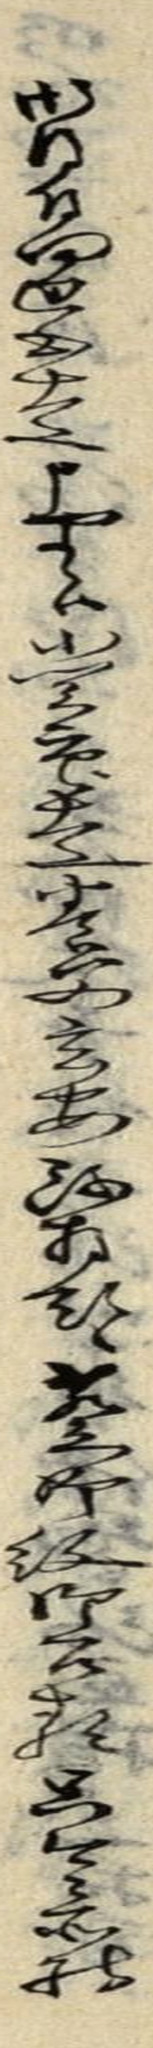御目付田辺五太夫申聞候は小関市郎太夫養父玄安致拝領候葵御紋御召類只今に所持
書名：蒐輯之部
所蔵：福井県文書館 Fukui Prefectural Archives
